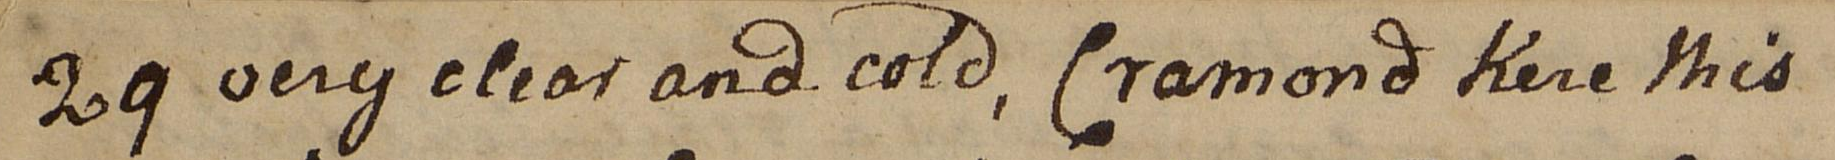29 very clear and cold, Cramond here this
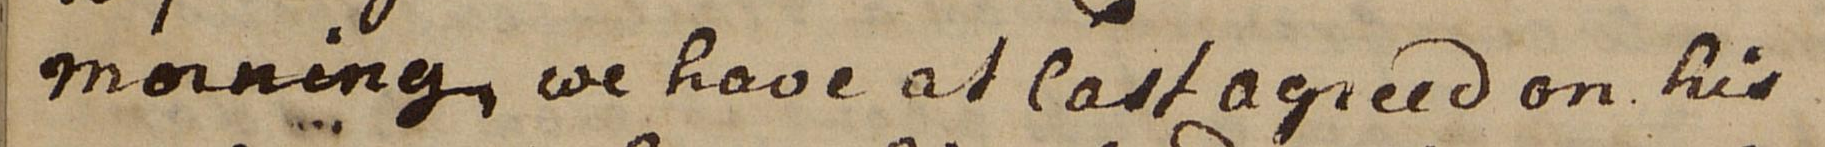morning, we have at last agreed on his
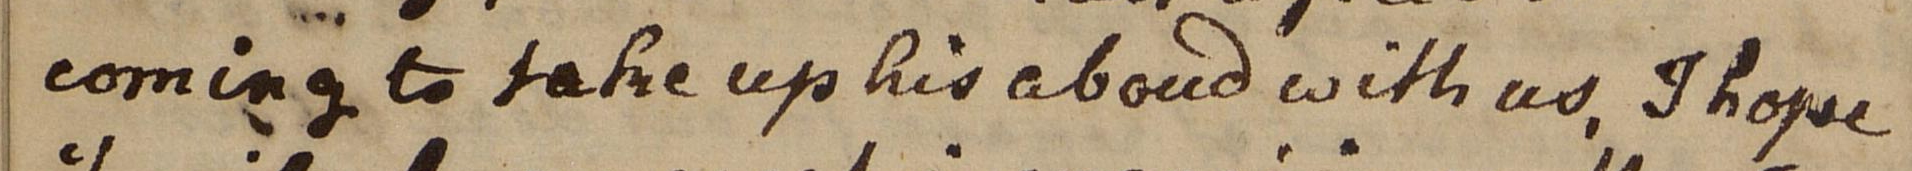coming to take up his aboud with us, I hope
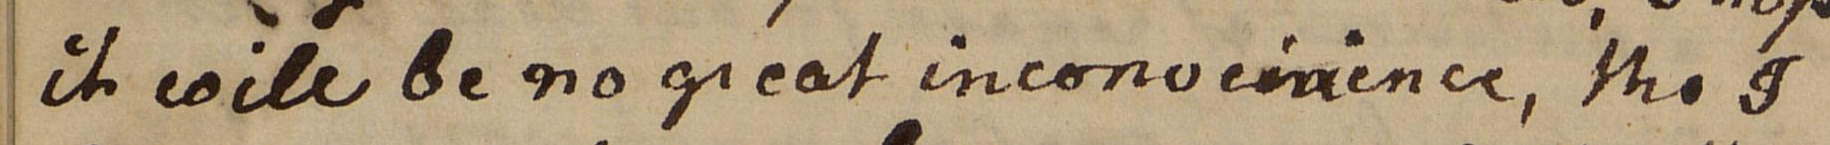it will be no great inconveinience, tho I
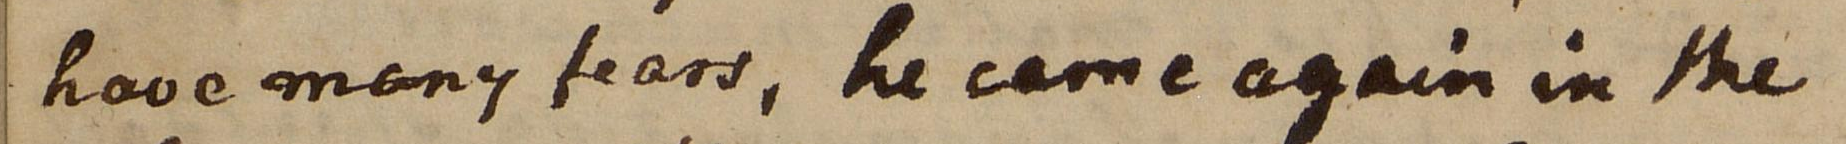have many fears, he came again in the
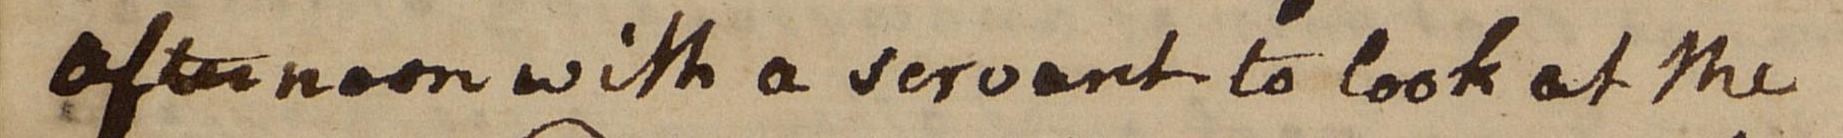Afternoon with a servant to look at the
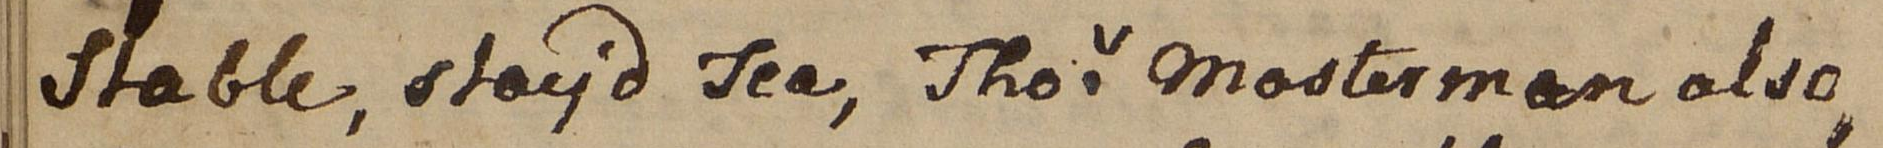Stable, stay'd Tea, Tho^s. Masterman also,
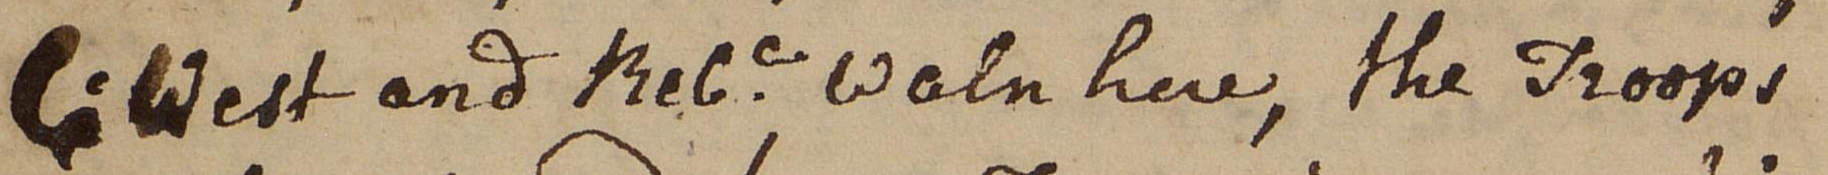C. West and Reb^a. Waln here, the Troops
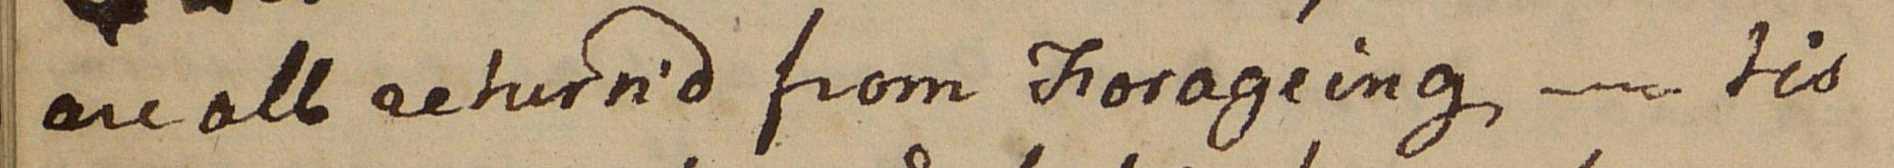are all return'd from Forageing- tis
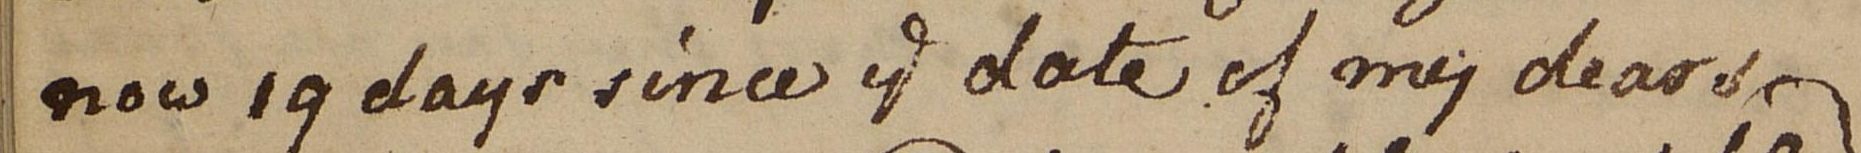now 19 days since y^e date of my dears
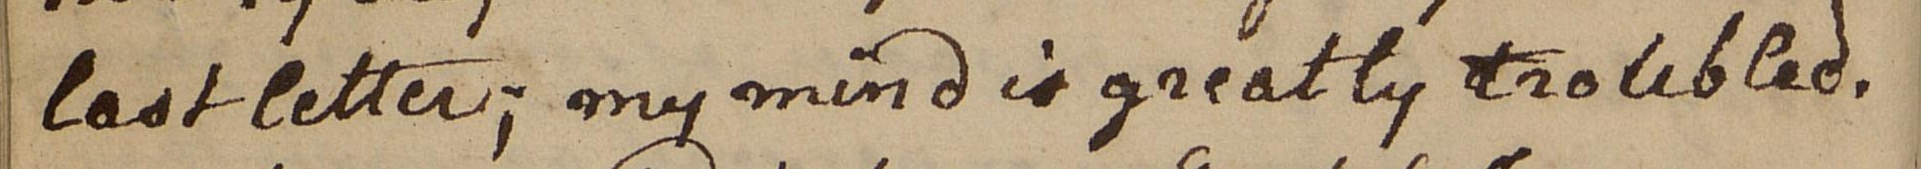last letter; my mind is greatly troubled.
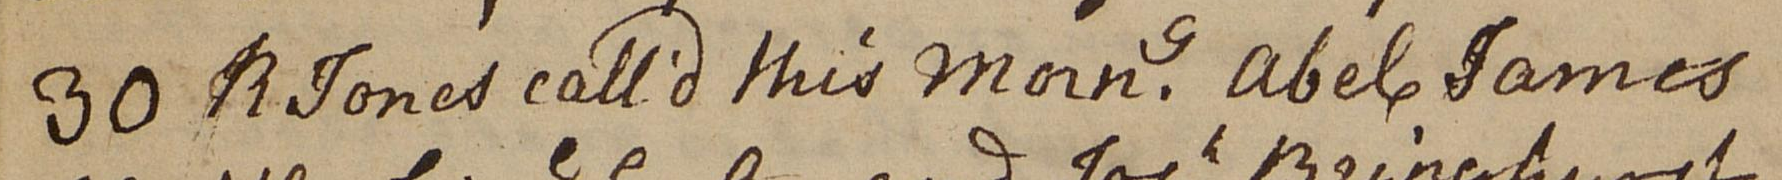30 R Jones call'd this Morn^g. Abel James
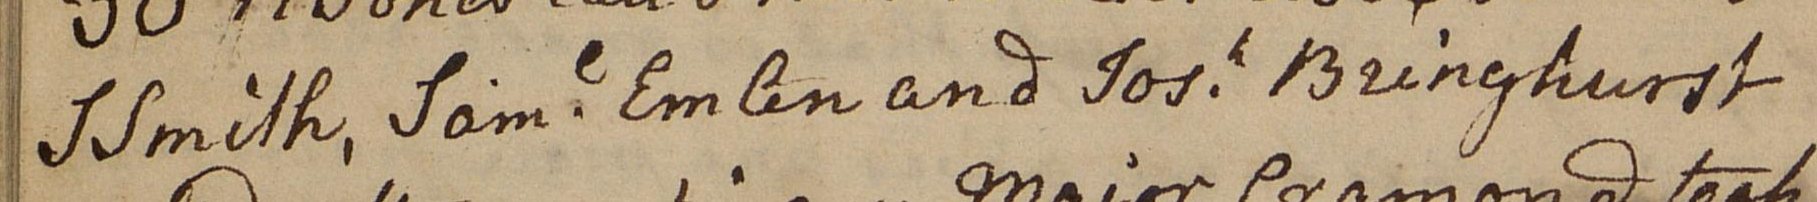S Smith, Sam^l. Emlen and Jos^h. Bringhurst
